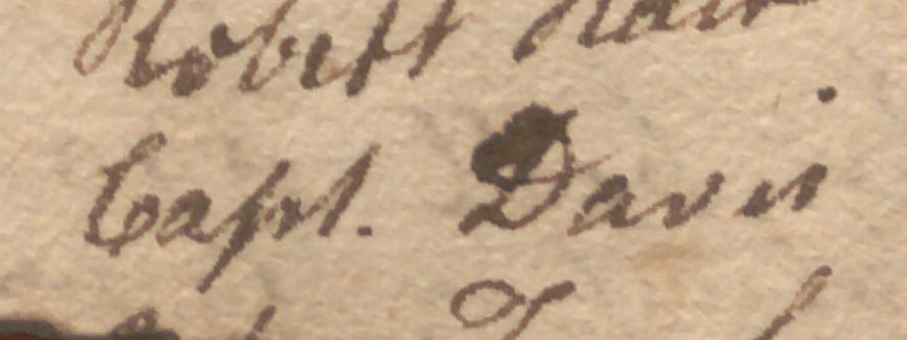Capt. Davis
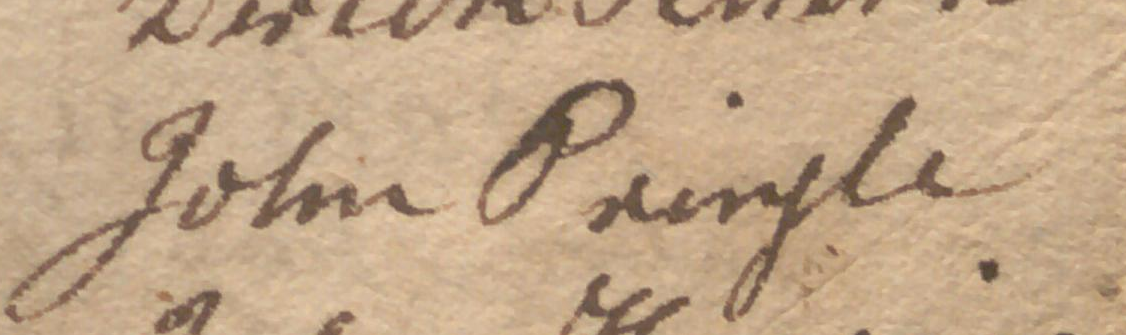John Pringle
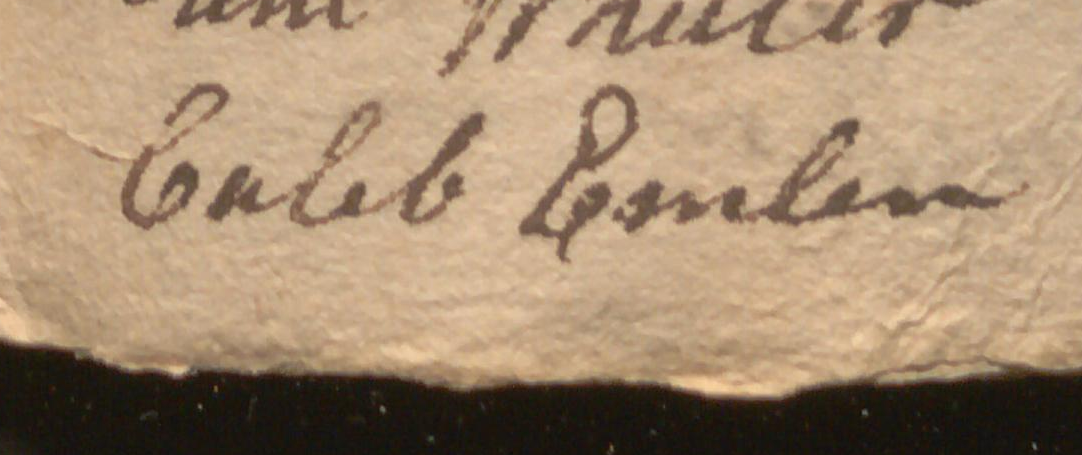Caleb Emlen
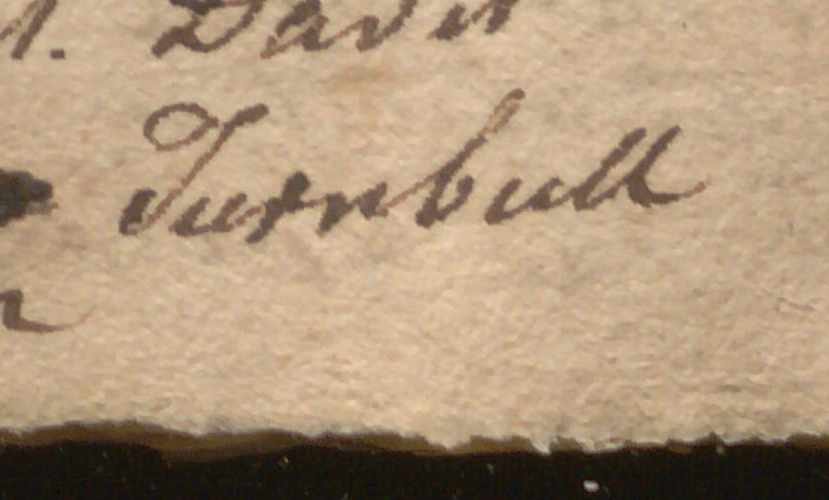Turnbell
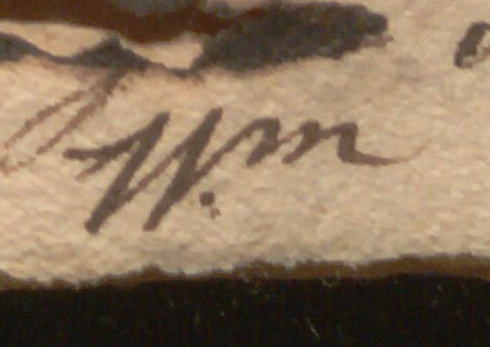W^m.
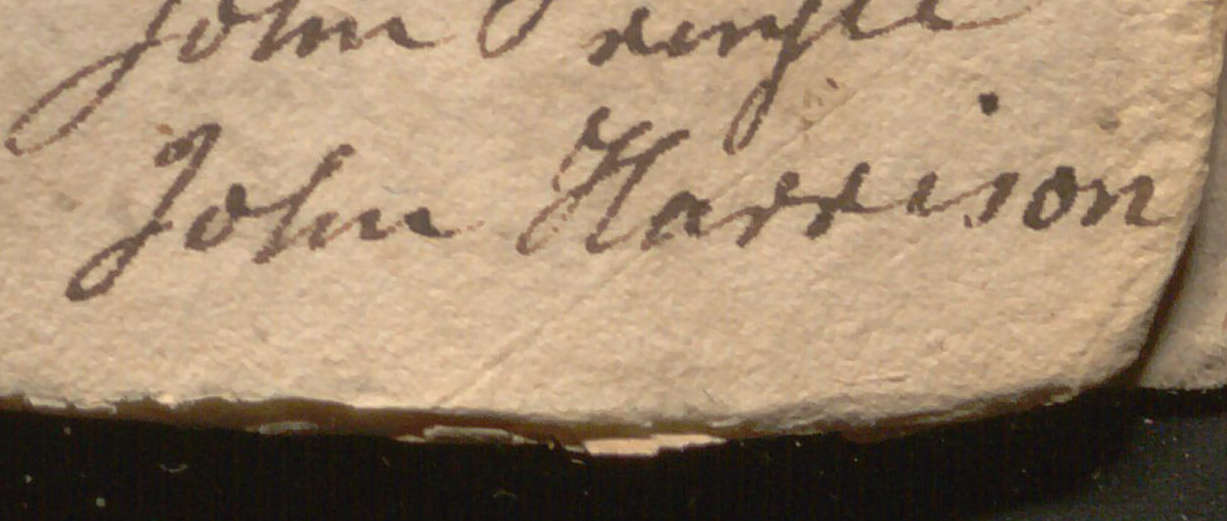John Harrison
